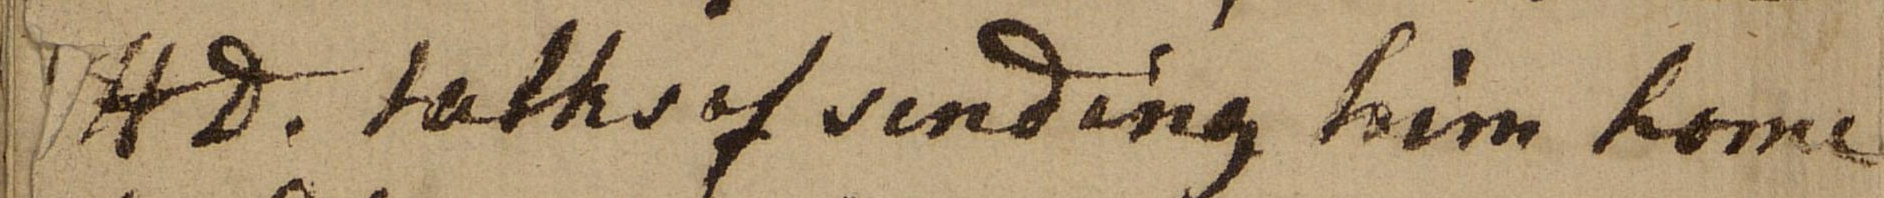HD. talks of sending him home
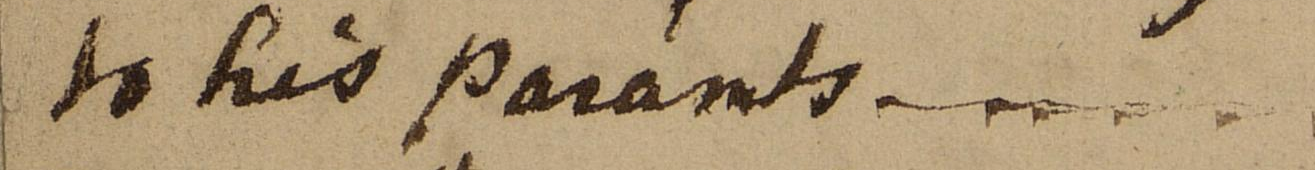to his parants---
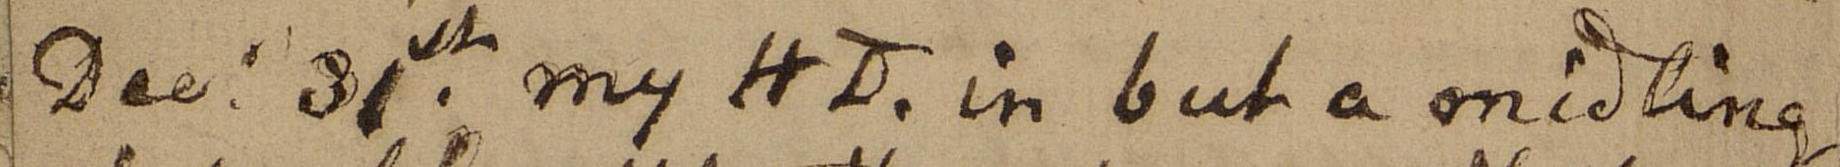Dec. 31^st. my HD. in but a midling
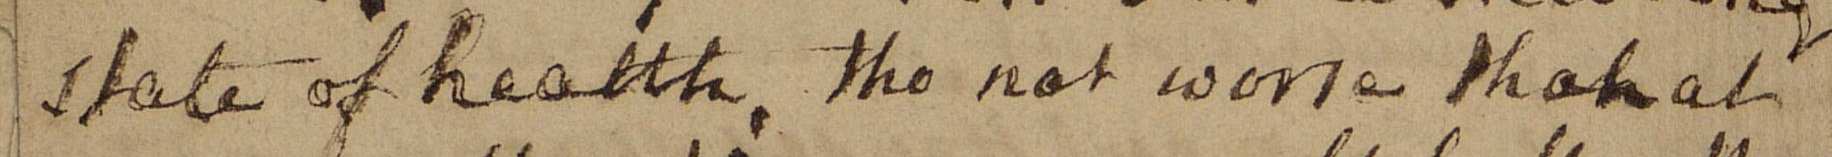state of health, tho not worse than at
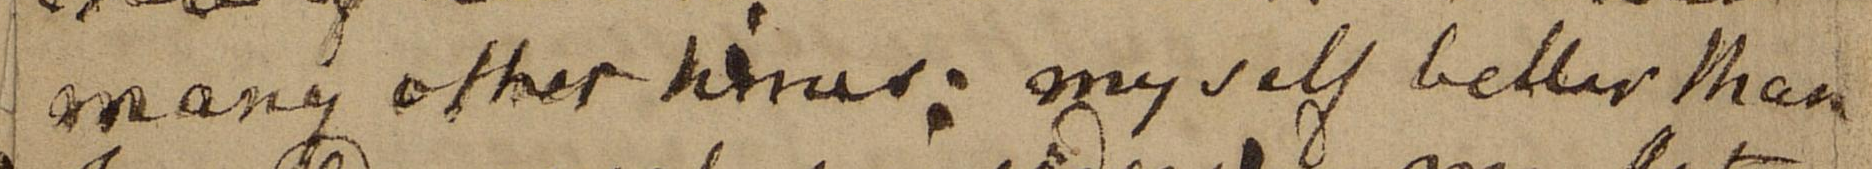many other times: myself better than
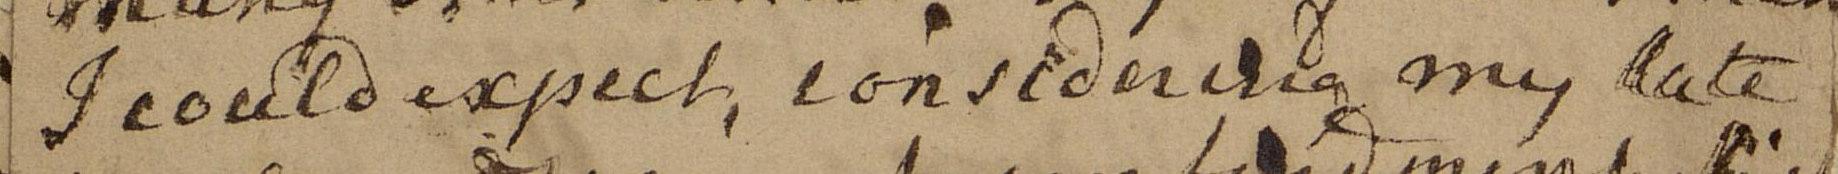I could expect, considering my late
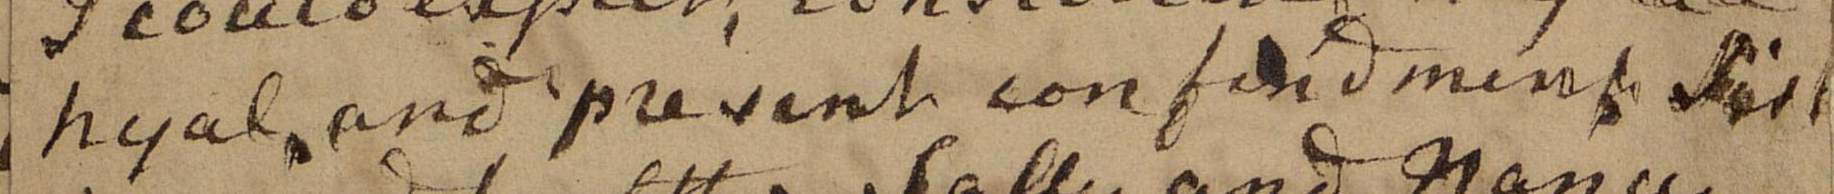tryal, and present confindment sit
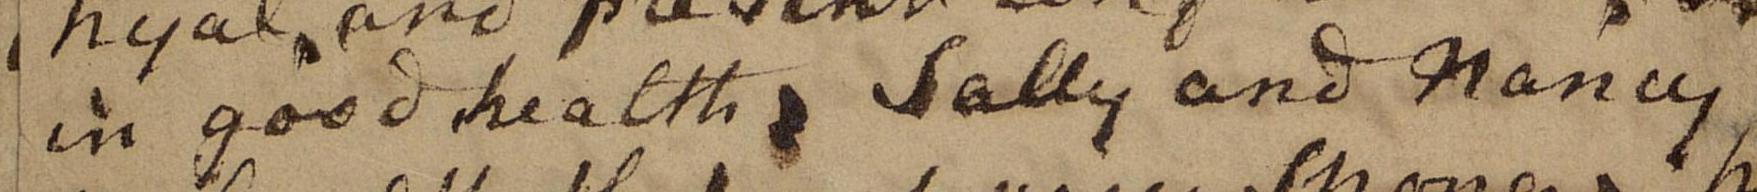in good health: Sally and Nancy
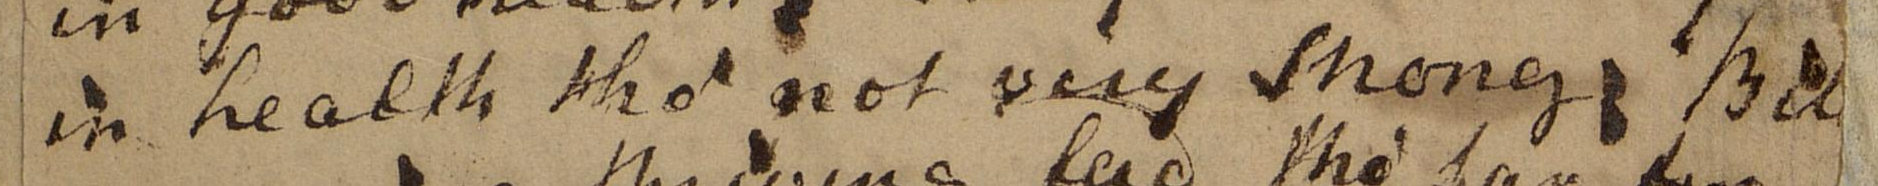in health tho' not very Strong: Bil
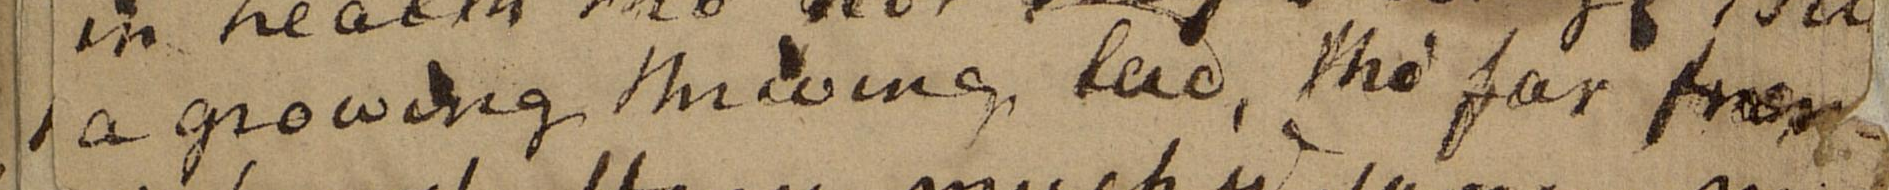a growing thriving lad, tho' far from
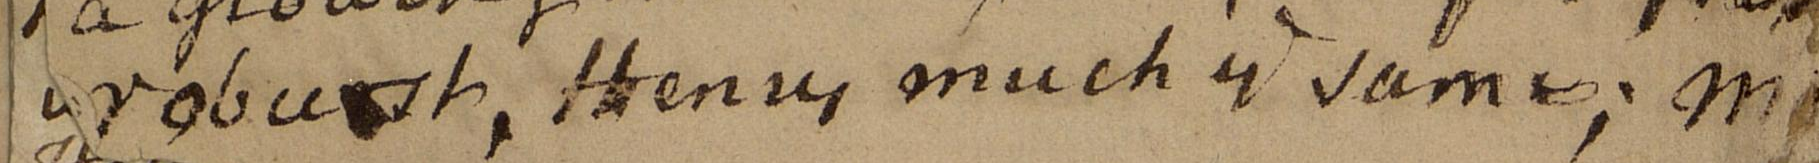robust, Henry y^e same; M
